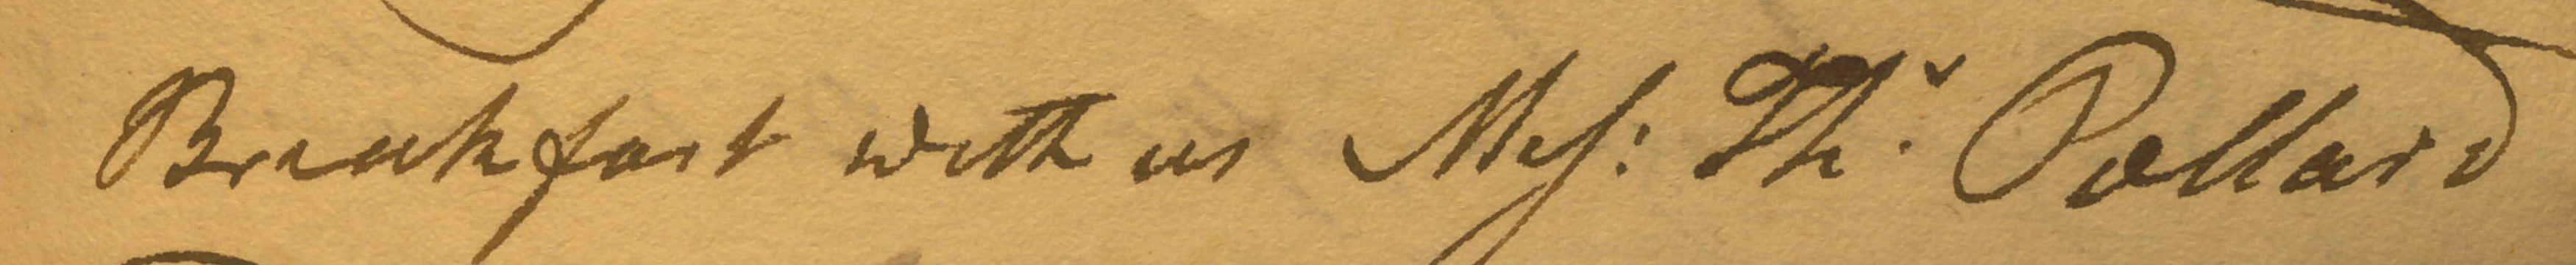Breakfast with us Mes: Th^s. Pollard
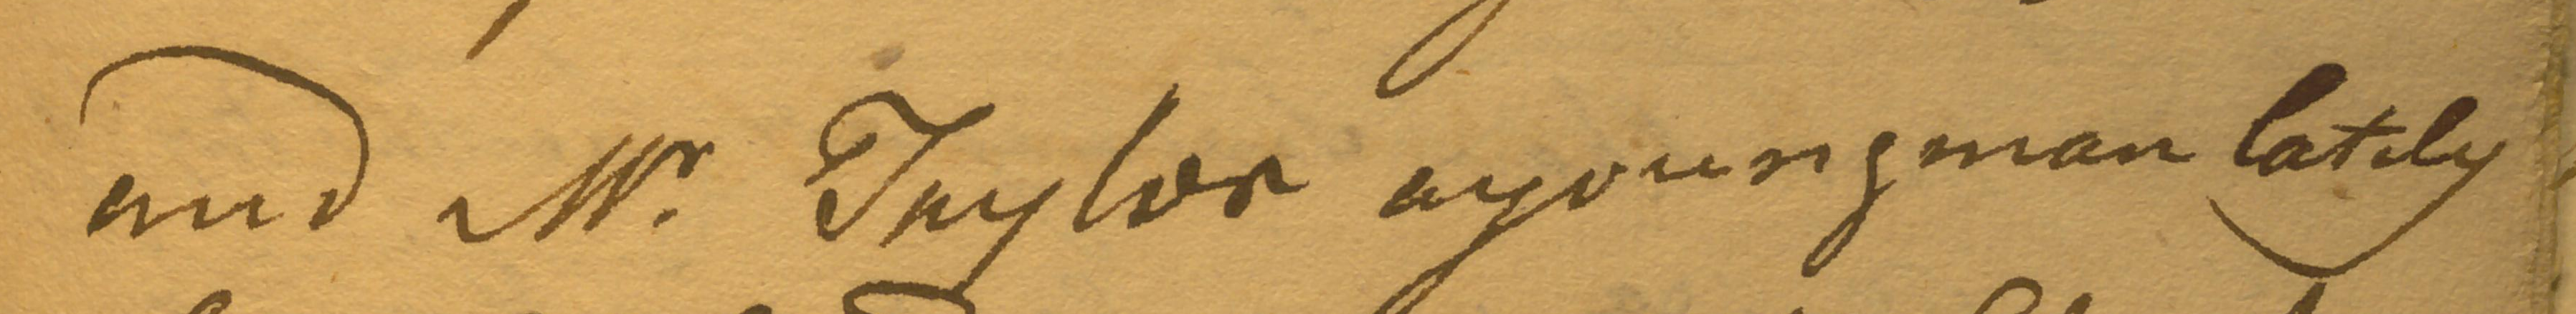and M^r. Taylor a young man lately
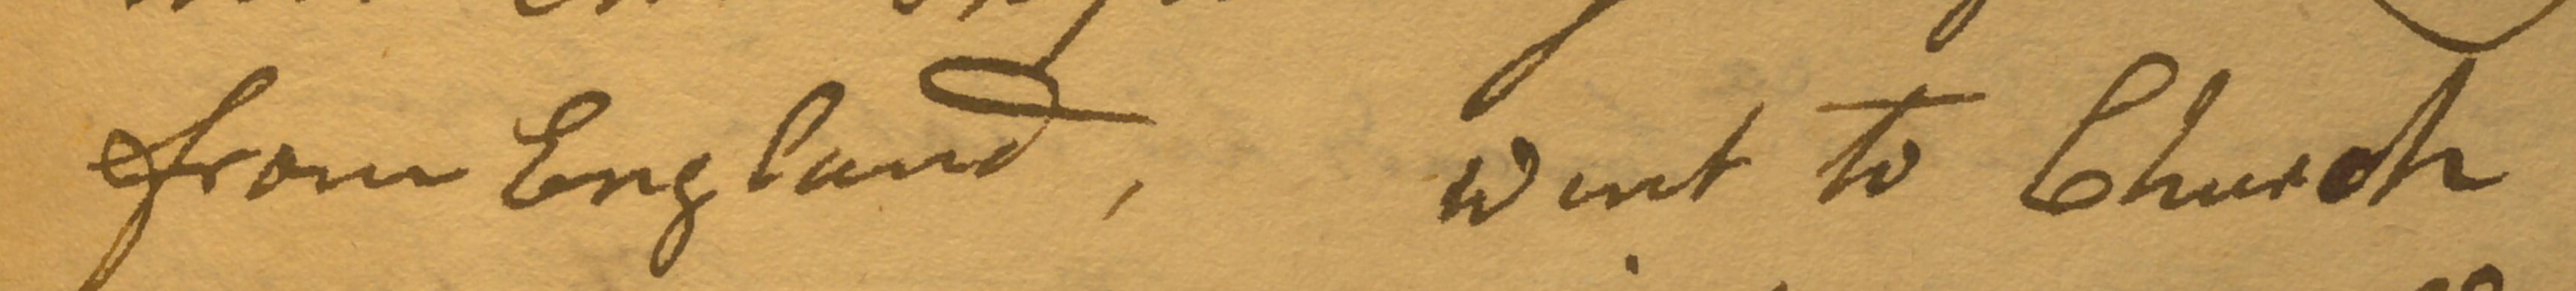from England, went to Church
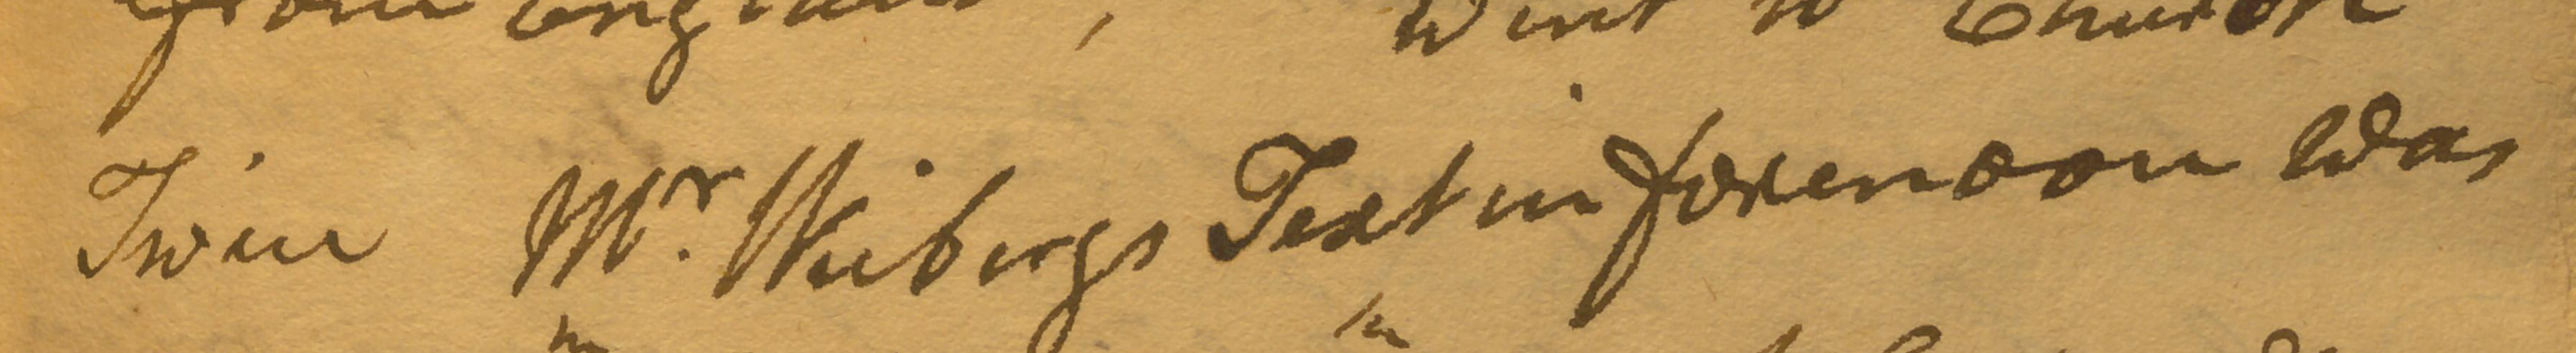Twice M^r. Weibergs Text in forenoon was
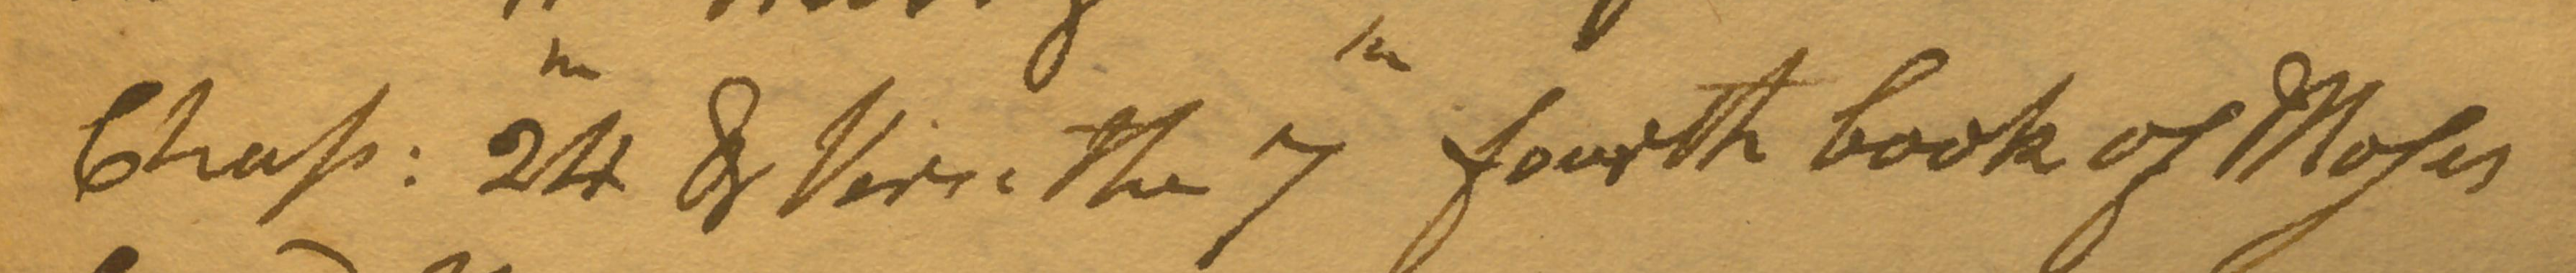Chap: 24^th & Verse the 7^th fourth book of Moses
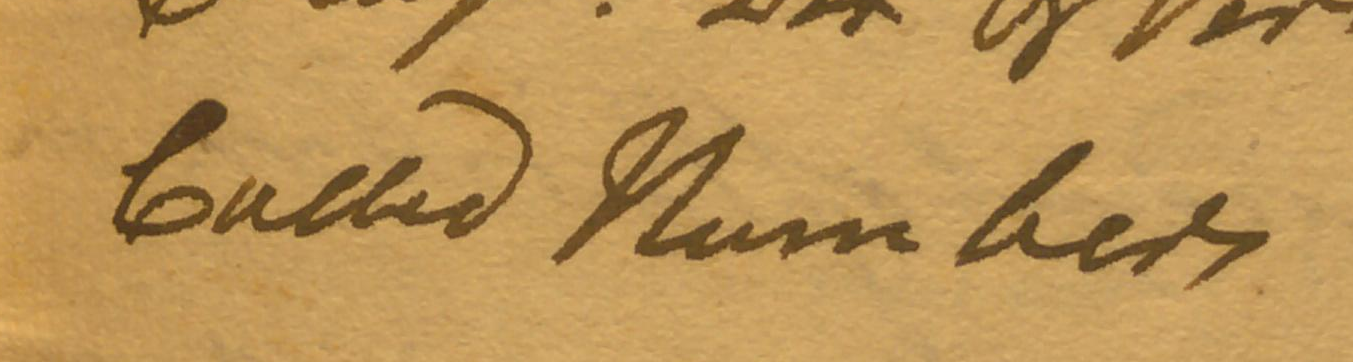Called Numbers
